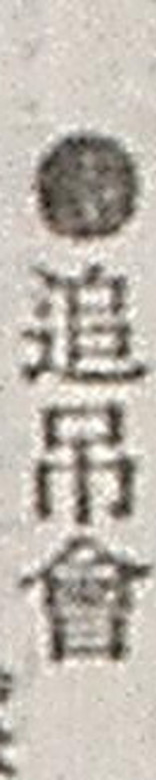●追吊会
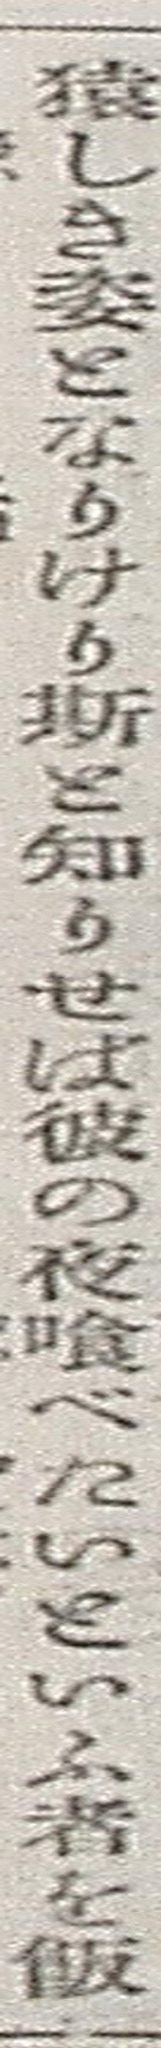猿しき姿となりけり斯と知りせば彼の夜喰べたいといふ者を飯
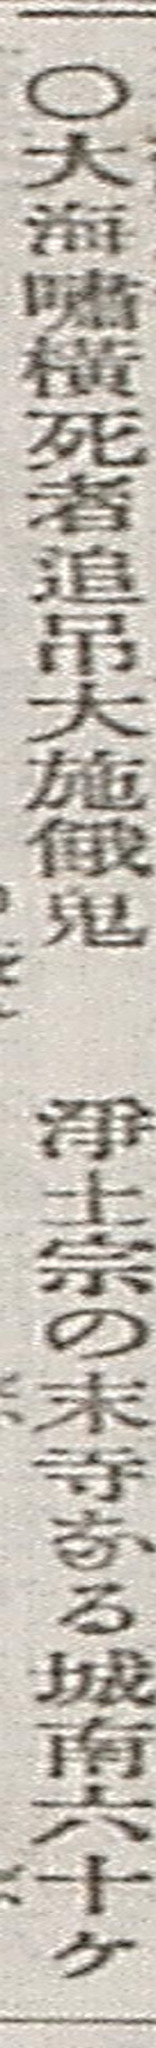○大海嘯横死者追吊大施餓鬼浄土宗の末寺なる城南六十ヶ
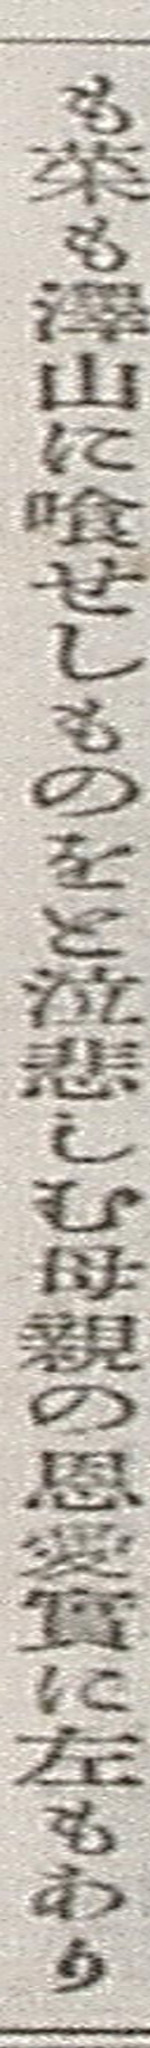も菜も沢山に喰せしものをと泣悲しむ母親の恩愛実に左もあり
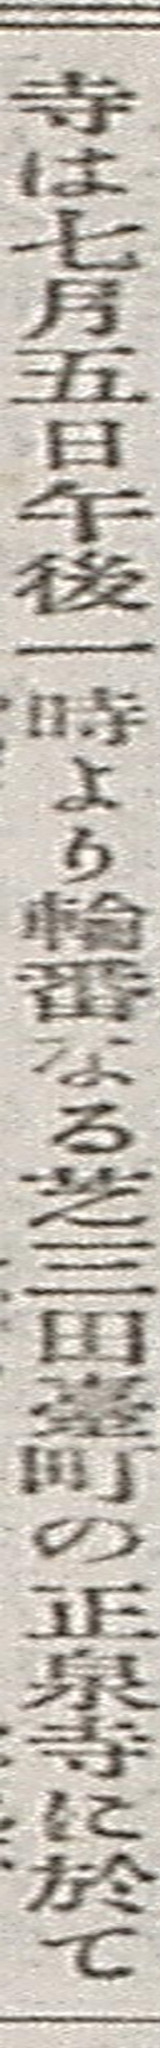寺は七月五日午後一時より輪番なる芝三田臺町の正泉寺に於て
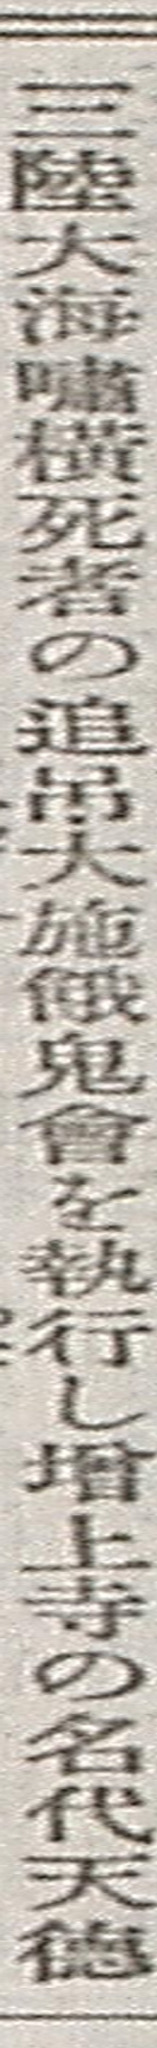三陸大海嘯横死者の追吊大施餓鬼会を執行し増上寺の名代天徳
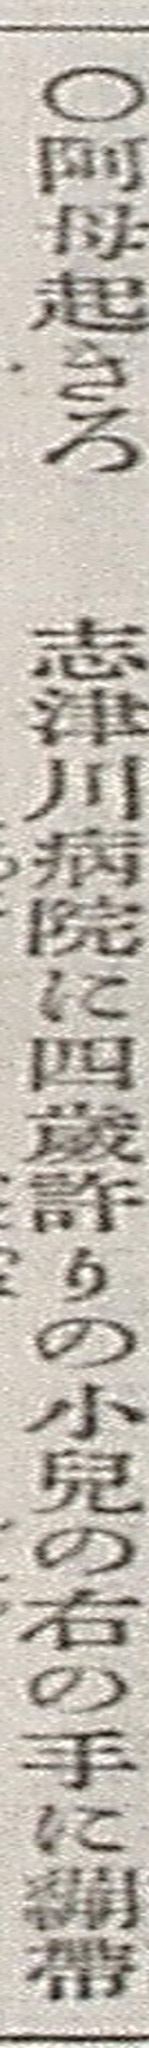○阿母起きろ志津川病院に四歳許りの小兒の右の手に繃帯
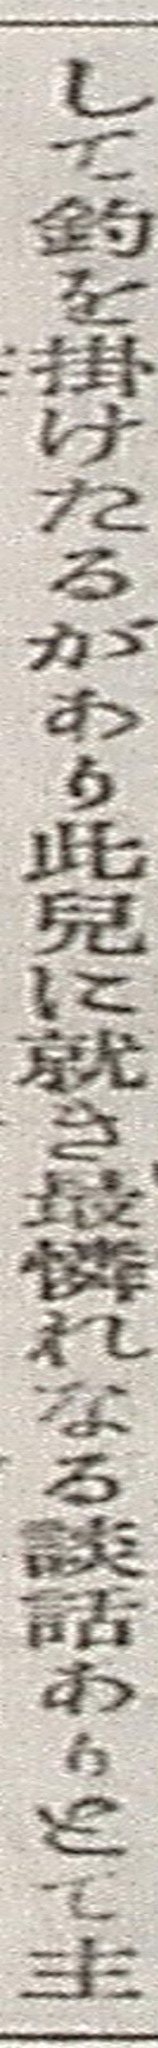して釣を掛けたるがあり此兒に就き最憐れなる談話ありとて主
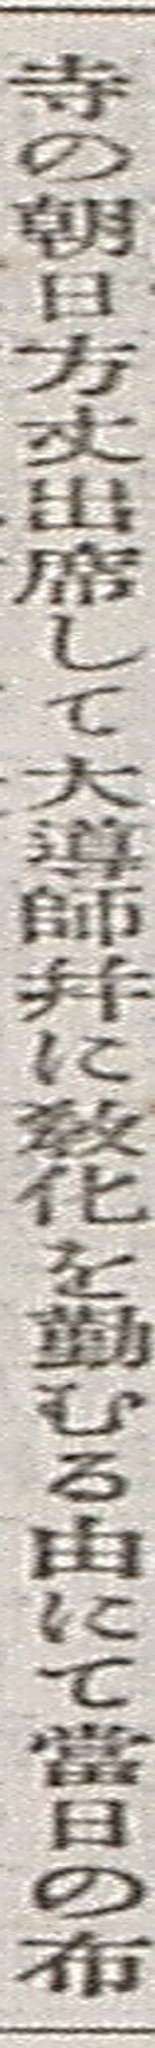寺の朝日方丈出席して大導師并に教化を勤むる由にて当日の布
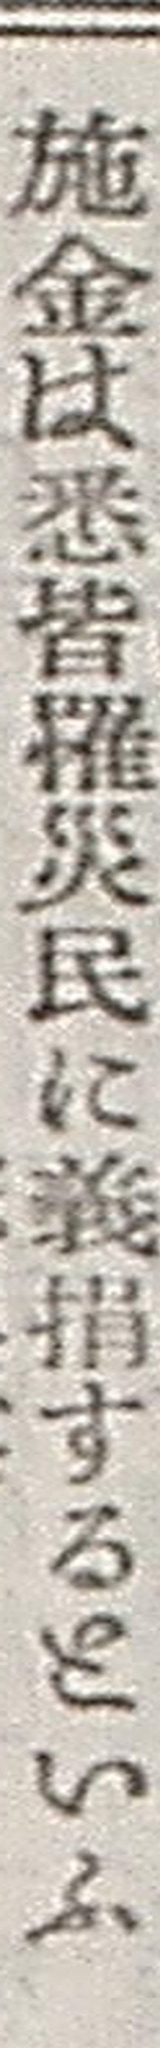施金は悉皆災民に義捐するといふ
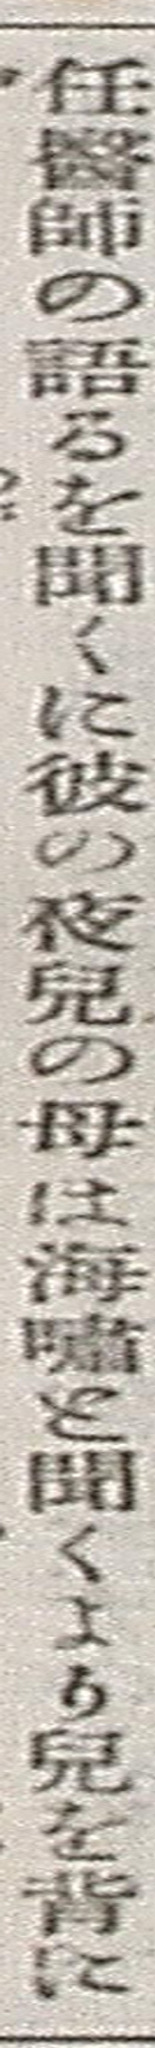任医師の語るを聞くに彼の夜兒の母は海嘯と聞くより兒を背に
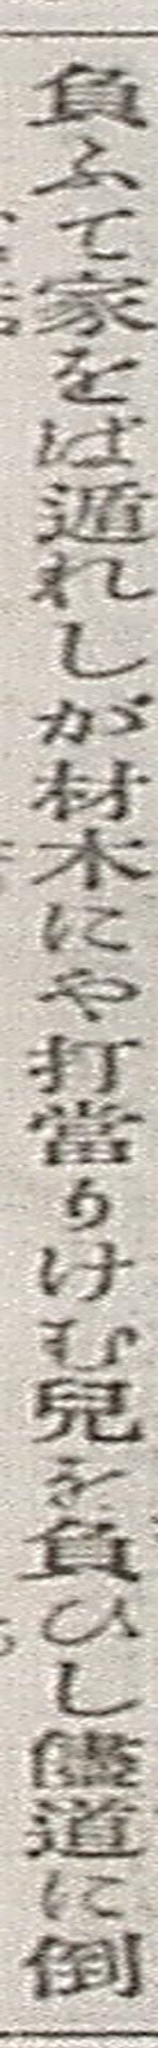負ふて家をば遁れしが材木にや打当りけむ兒を負ひし侭道に倒
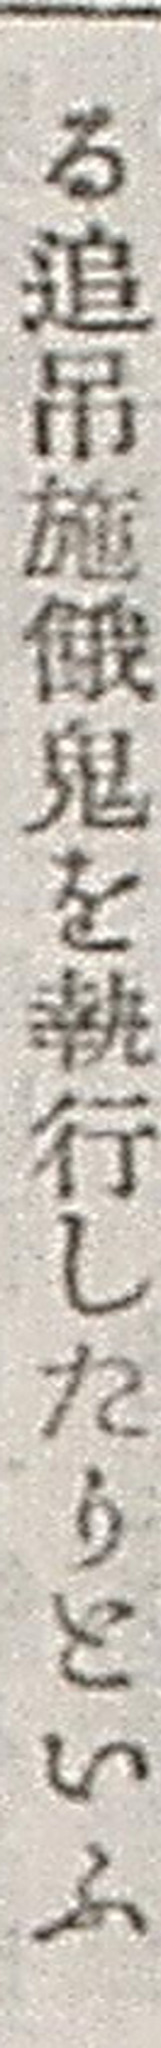る追吊施餓鬼を執行したりといふ
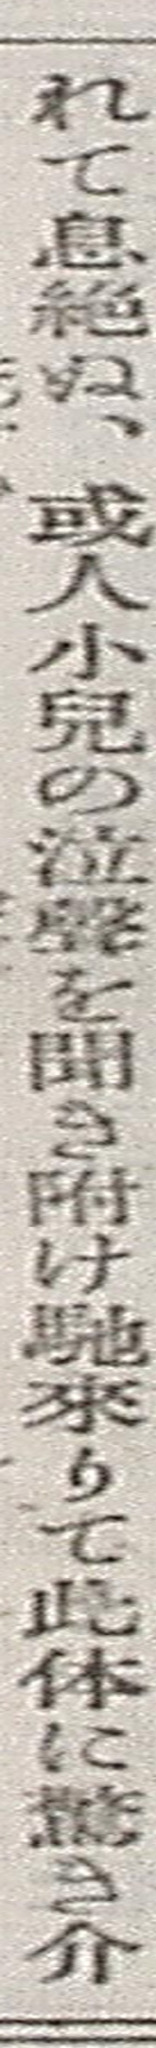れて息絶ぬ、或人小兒の泣声を聞き付け馳来りて此体に驚き介
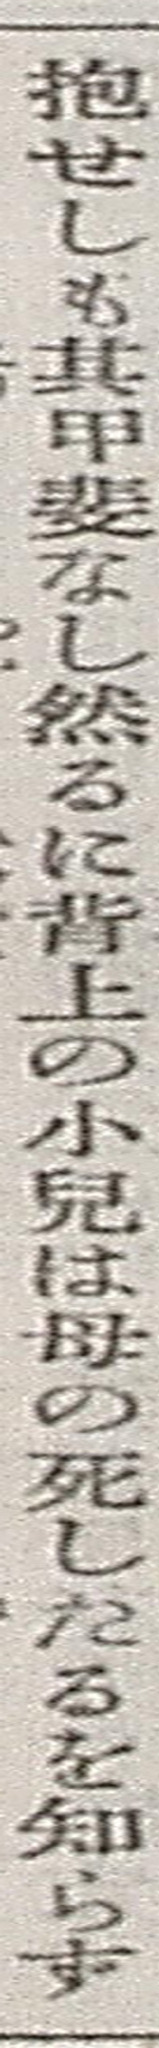抱せしも其甲斐もなし然るに背上の小兒は母の死たるを知らず
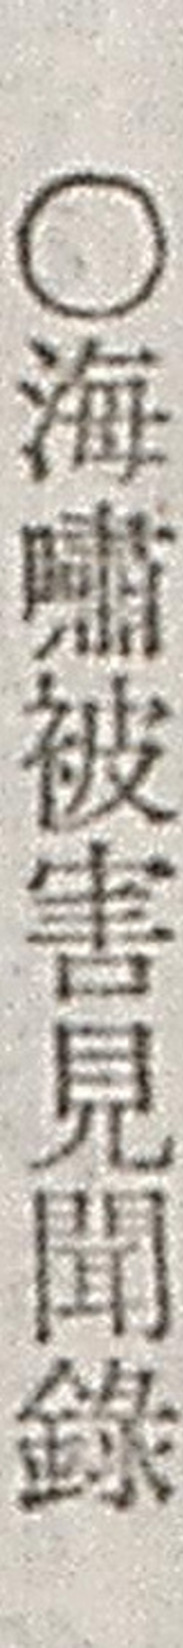○海嘯被害見聞録
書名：風俗畫報臨時増刊第百二十號　大海嘯被害録（下）
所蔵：東京大学地震研究所図書室 Earthquake Research Institute Library, The University of Tokyo, JAPAN
